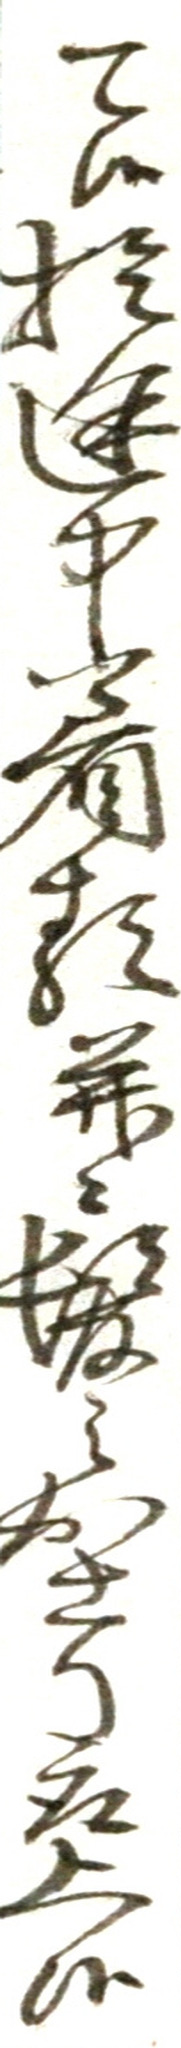て候於連中着類幷髪之かさり取上候
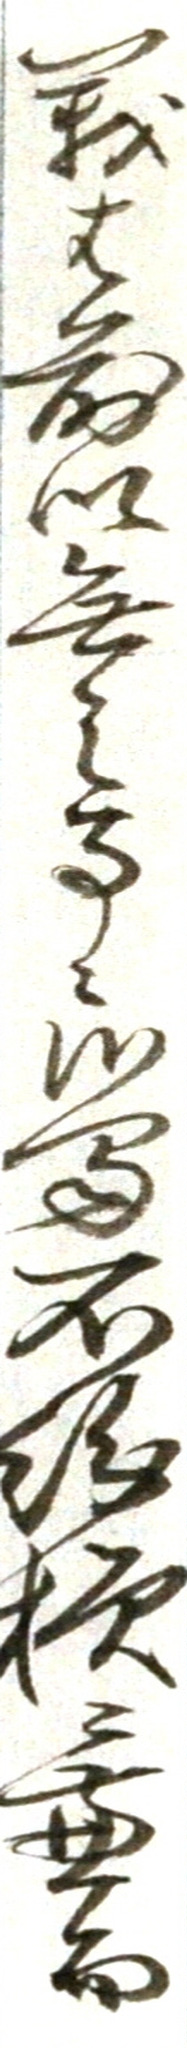義者前以無之事ニ候間不紛様ニ重而
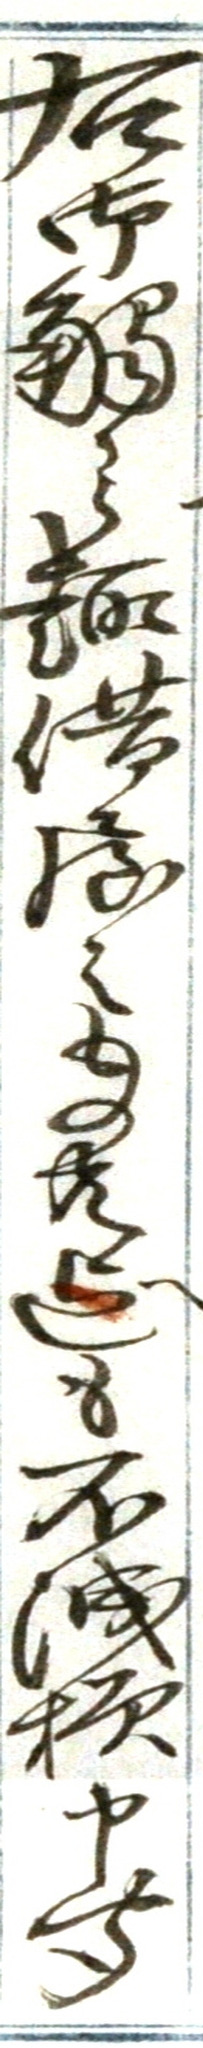右御触之趣借屋之もの共へ迄も不洩様申聞く
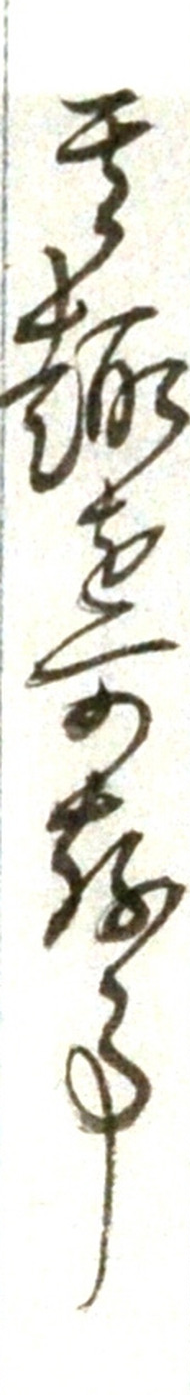其趣を可存事
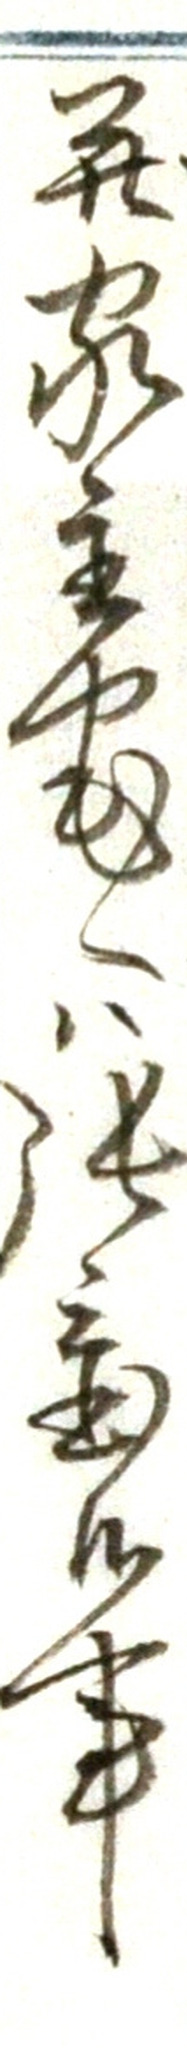幷家主宅へハ張置候事
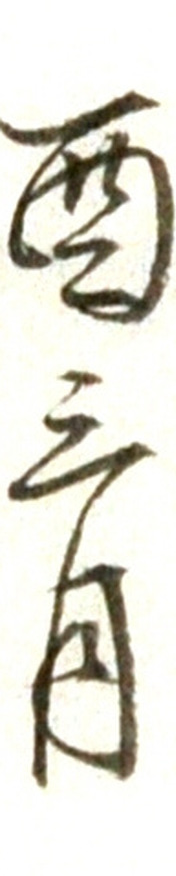酉三月
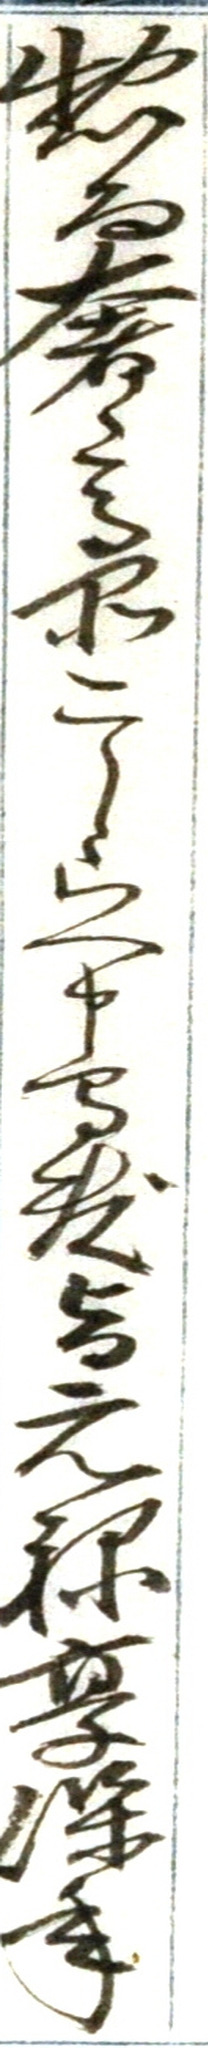惣而奢高品こしらへ申間敷旨元禄享保年
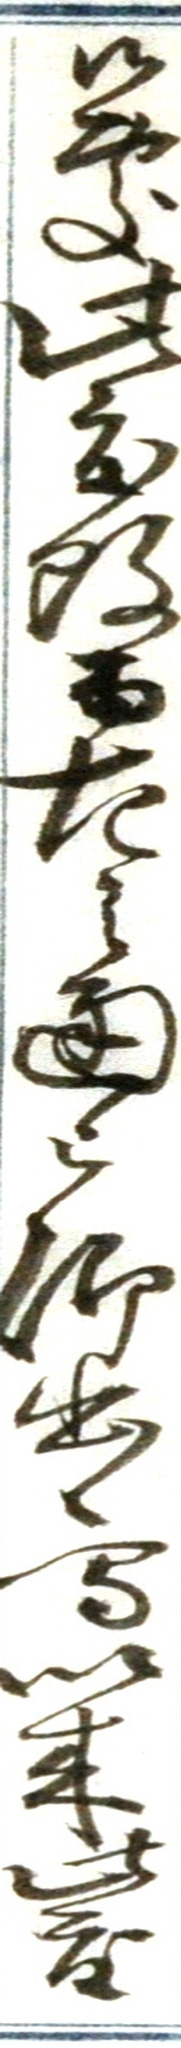候処此度改而左之通被仰出候間以来此度
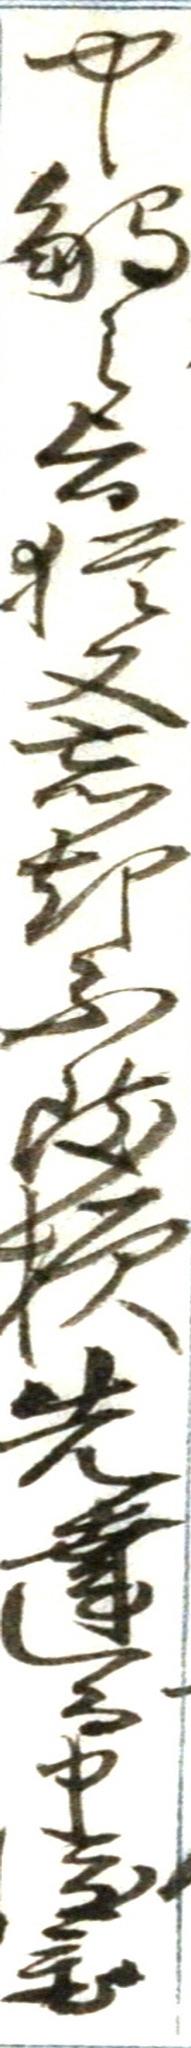中触之旨猶又忘却不致様先達而申渡置
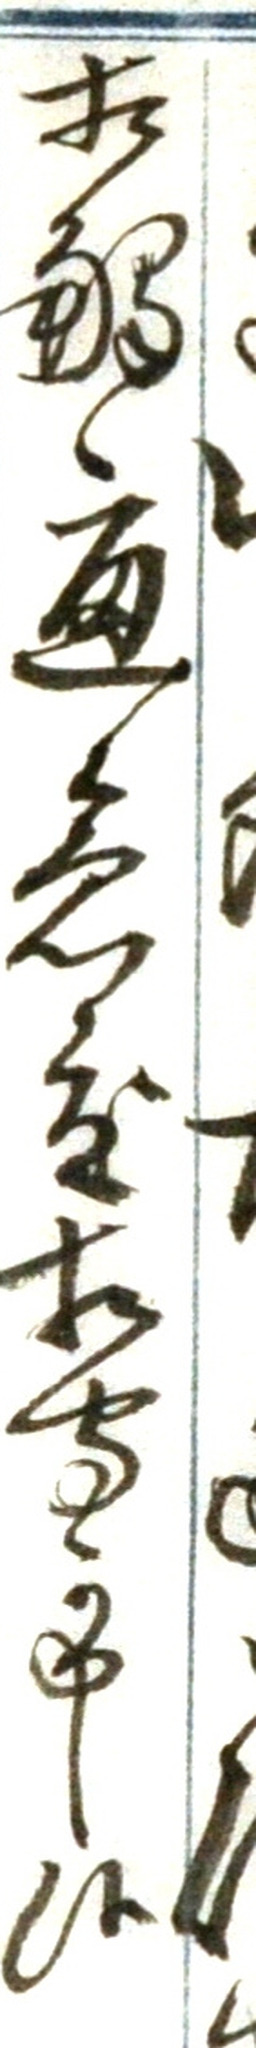相触候通急度相守可申候
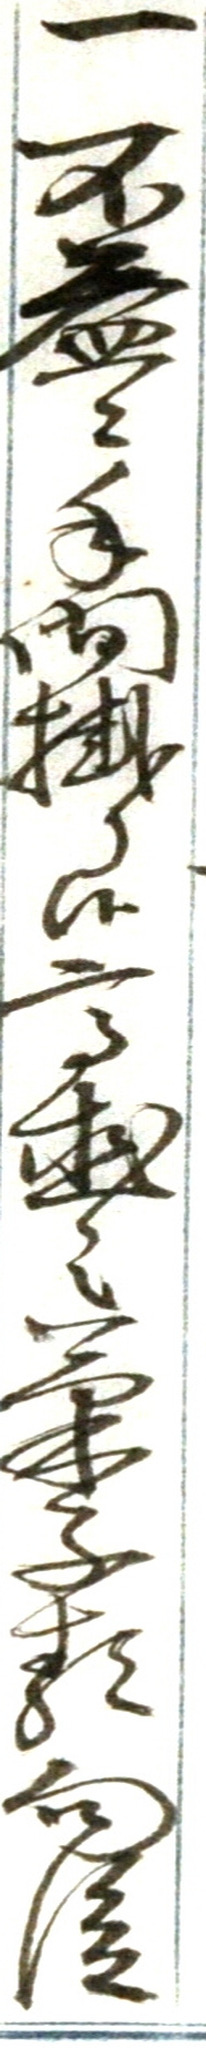一不益々手間掛り候か高直之菓子類向後
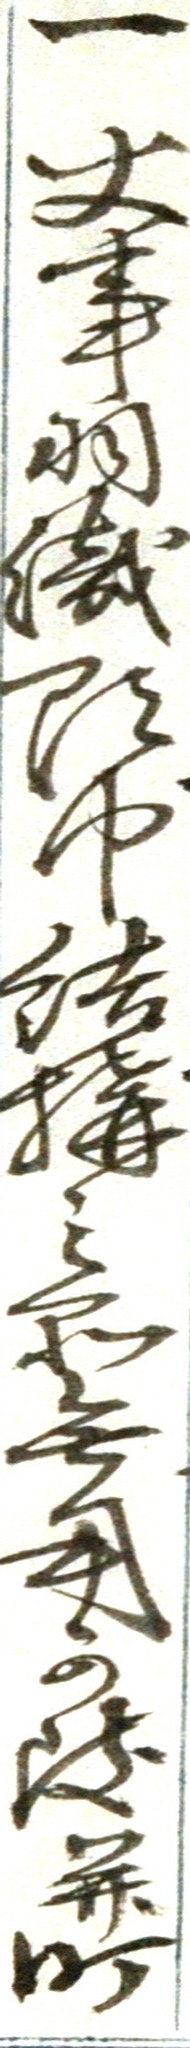一火事羽織頭中結構之品無用可致幷町
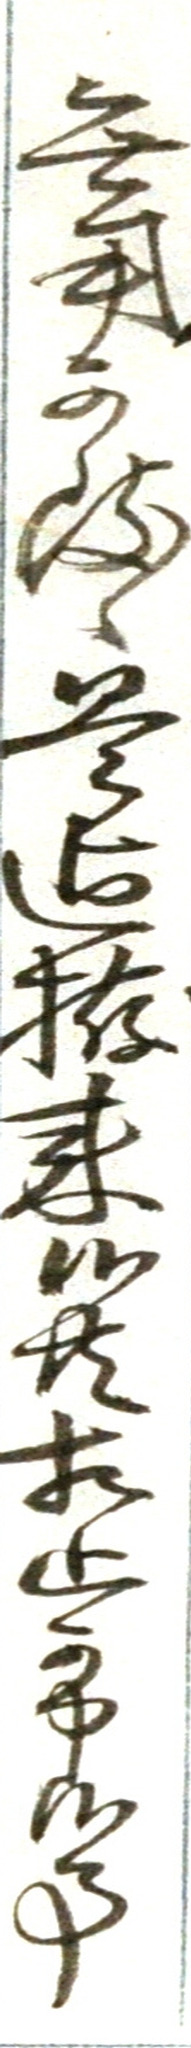無用可致候是迄拵来候共相止可申候事
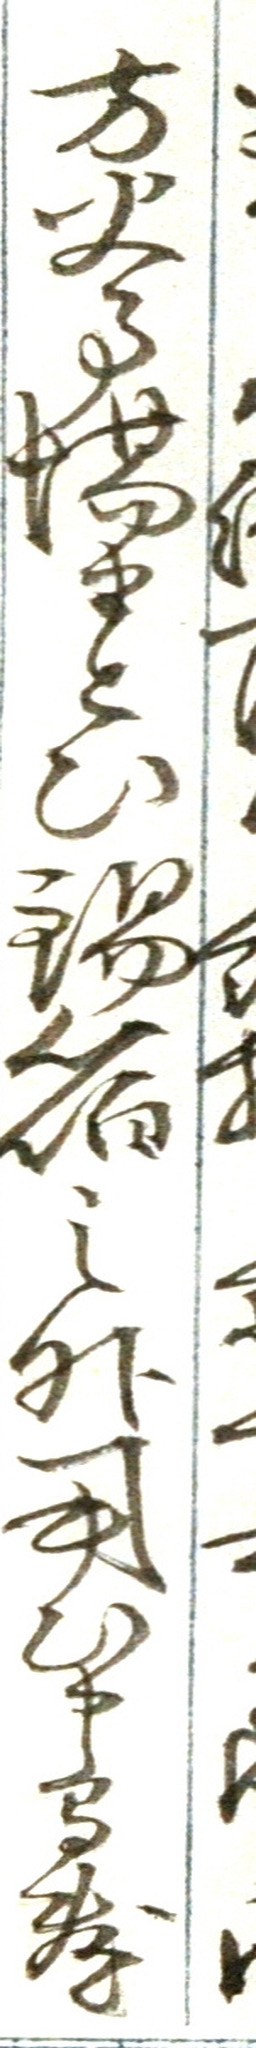方か火事場まとひ錫箱之外用ひ申間敷候

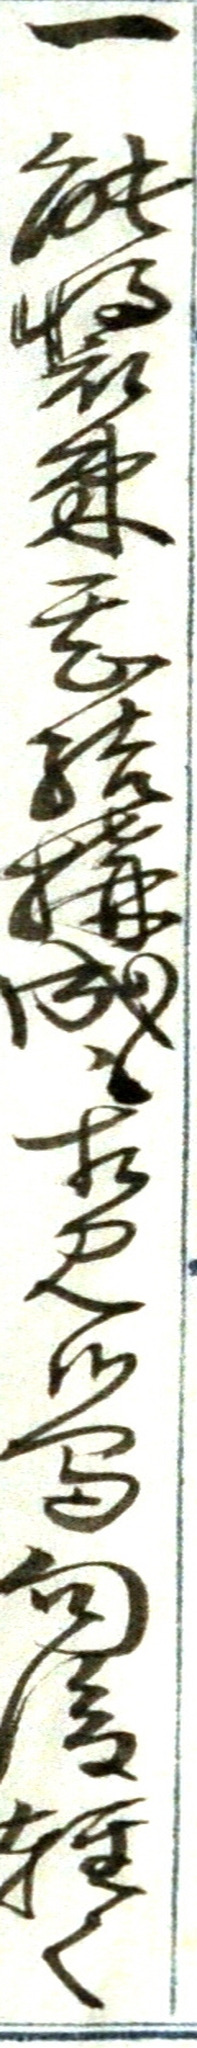一能装束甚結構成と相見候間向後軽く
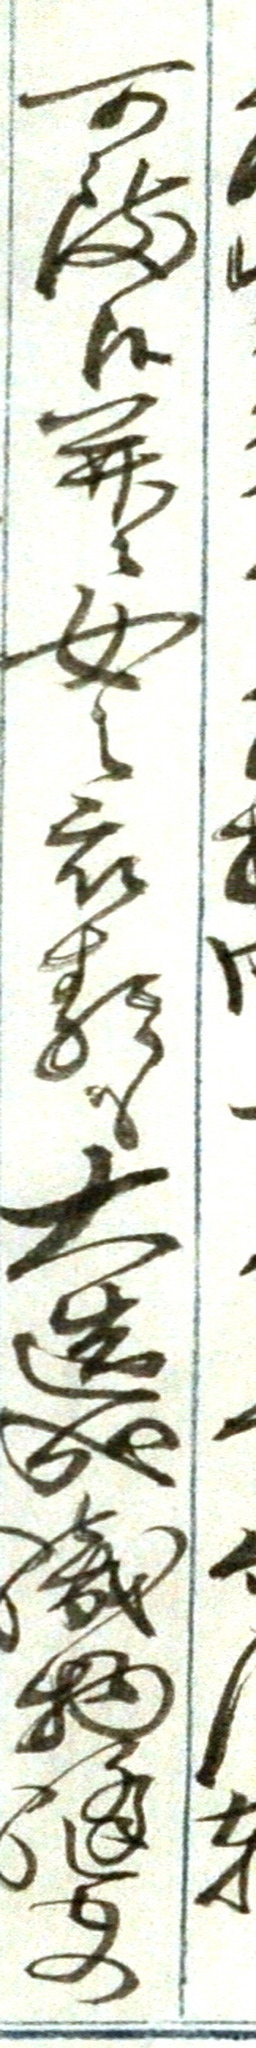可致候幷ニ女之衣類も大造成織物縫もの
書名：町方御触書・二通
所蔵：伊那市立高遠町図書館・合同会社AMANE
